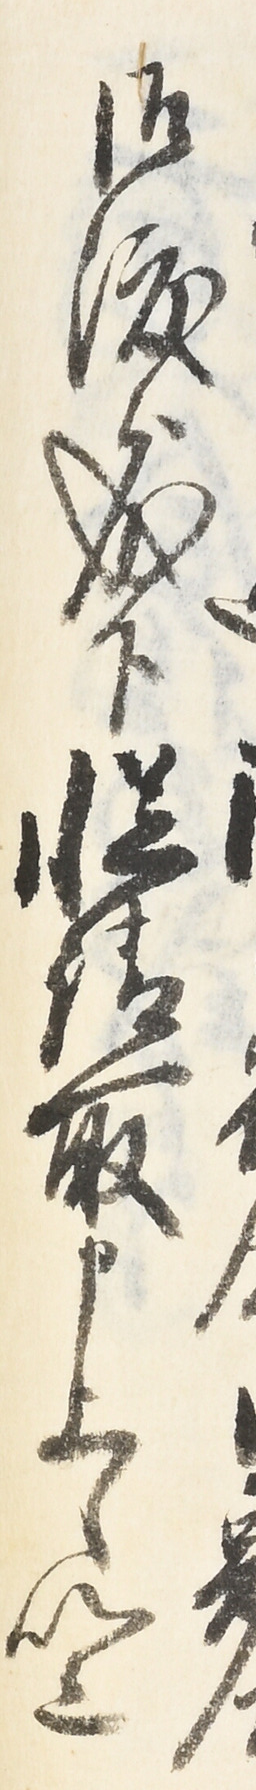御渡被成下慥請取申上候以上
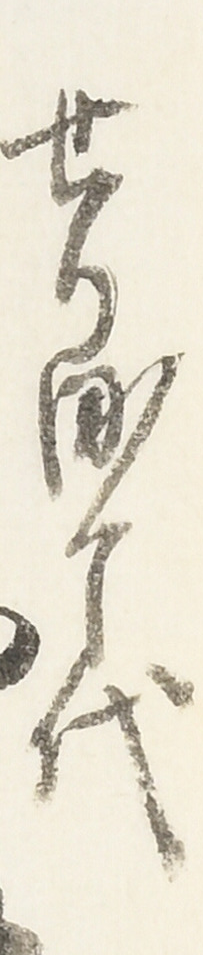せり町丁代
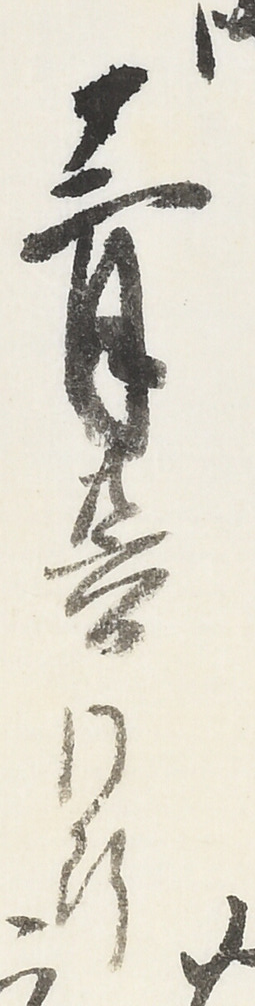十二月廿六日同断
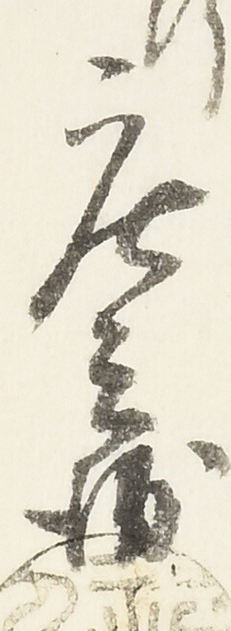庄兵衛
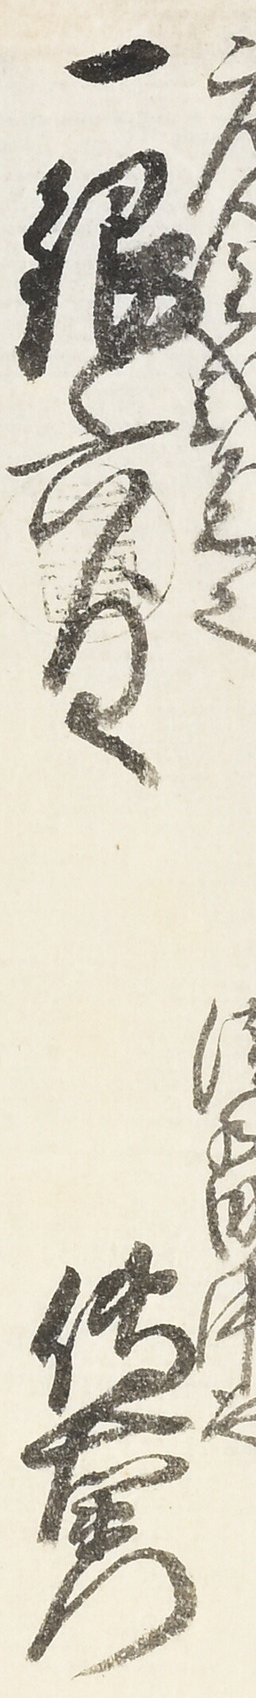一銀六匁傳右衛門
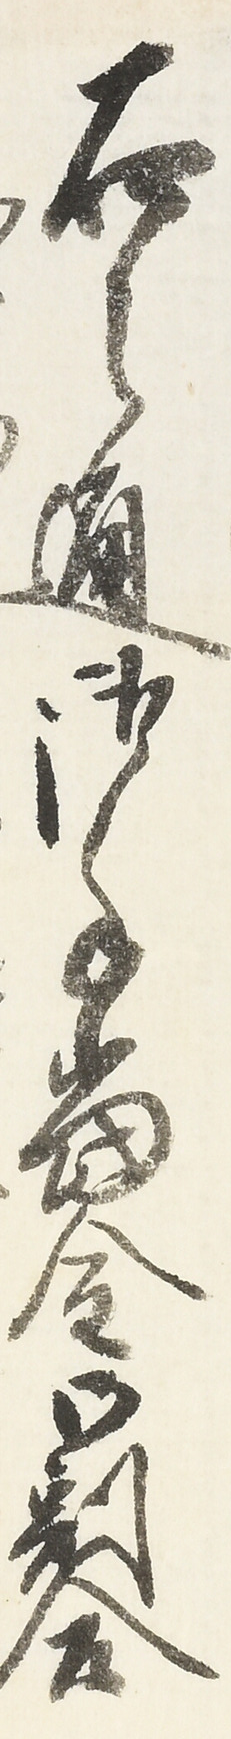右之通御手当金御割合
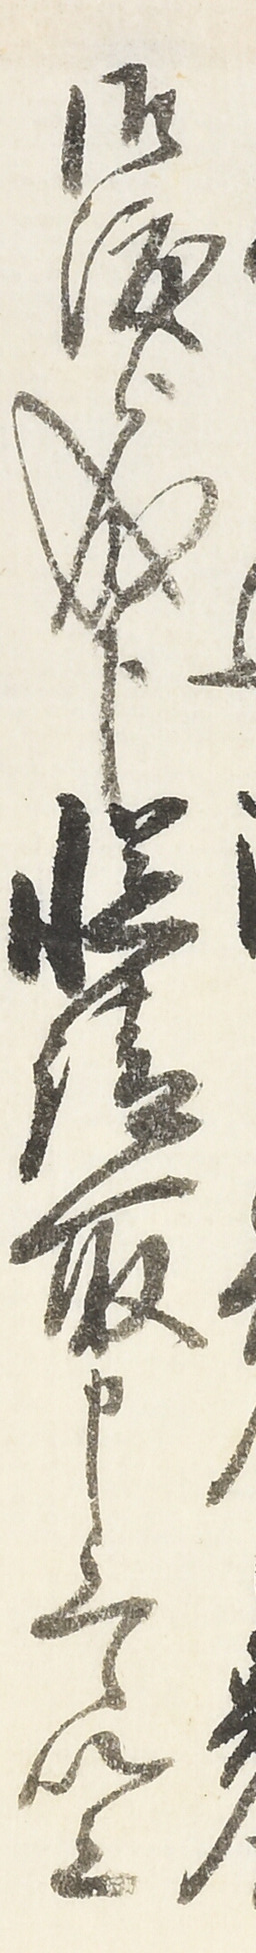御渡被成下慥請取申上候以上
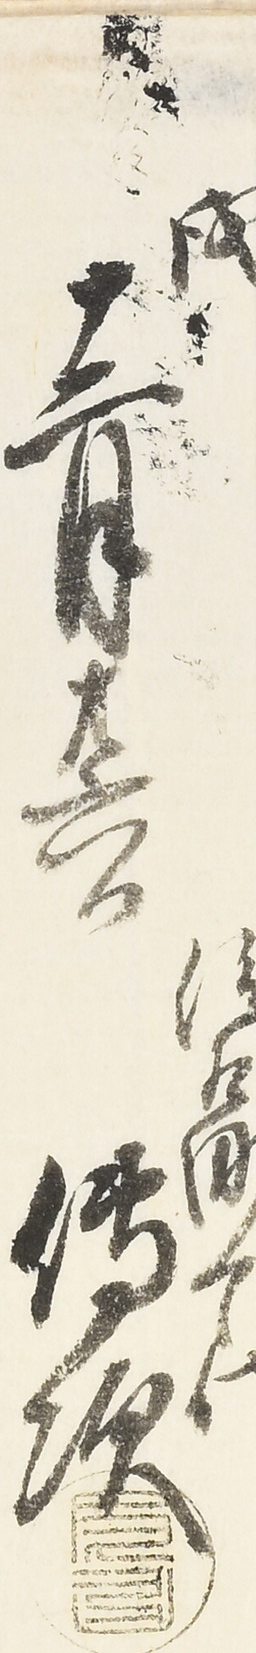十二月廿六日傳次
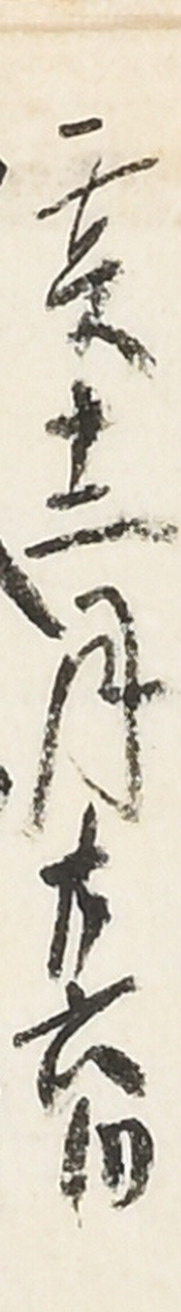亥十二月廿六日
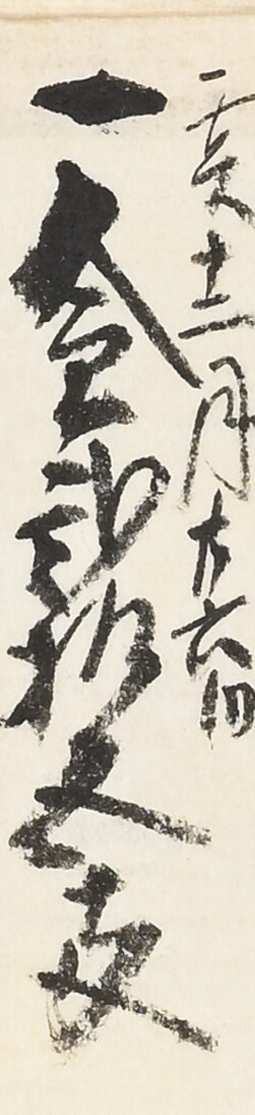一金弐拾五両
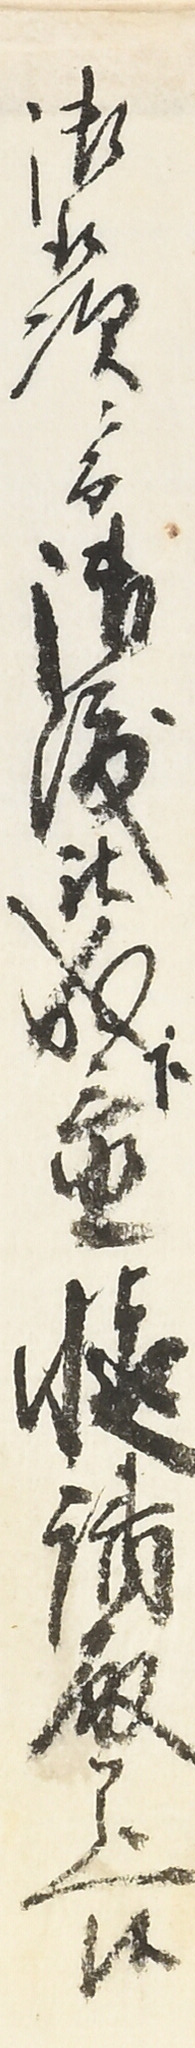御取次ニ而御渡被成下置慥請取申上候
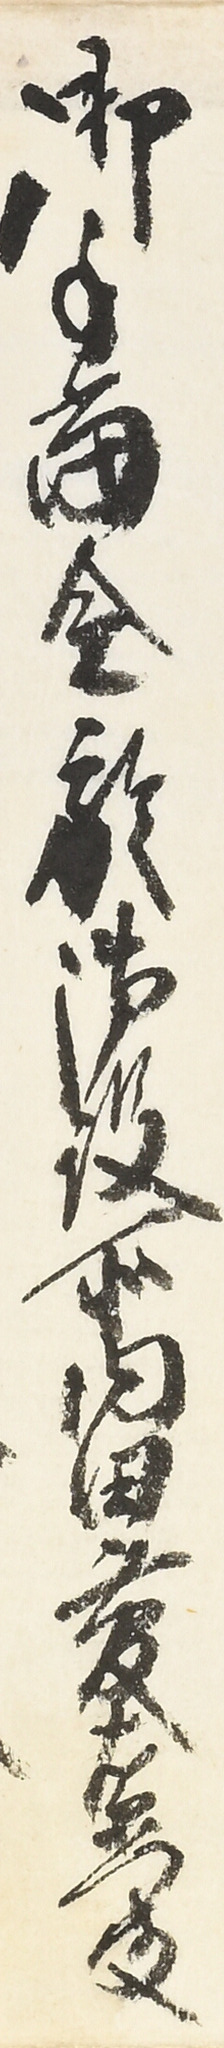御手当金於御役所内田藤左衛門殿
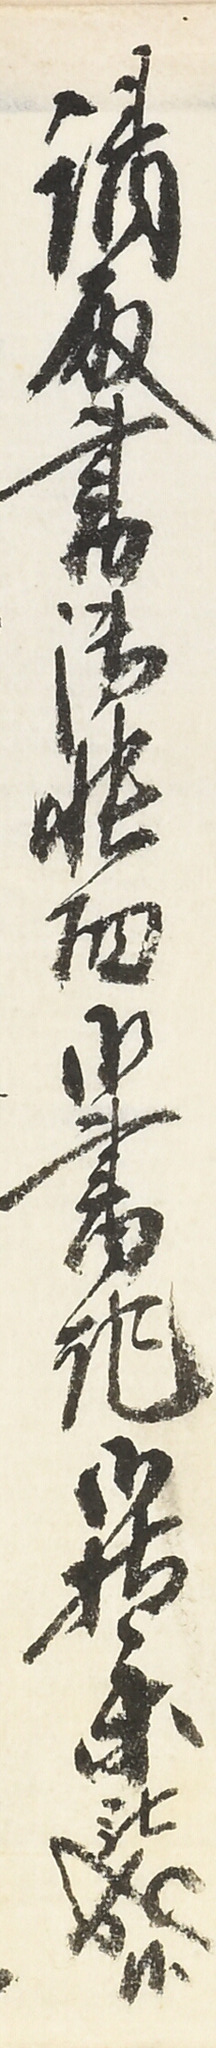請取書御帳面御書記御持参被成候
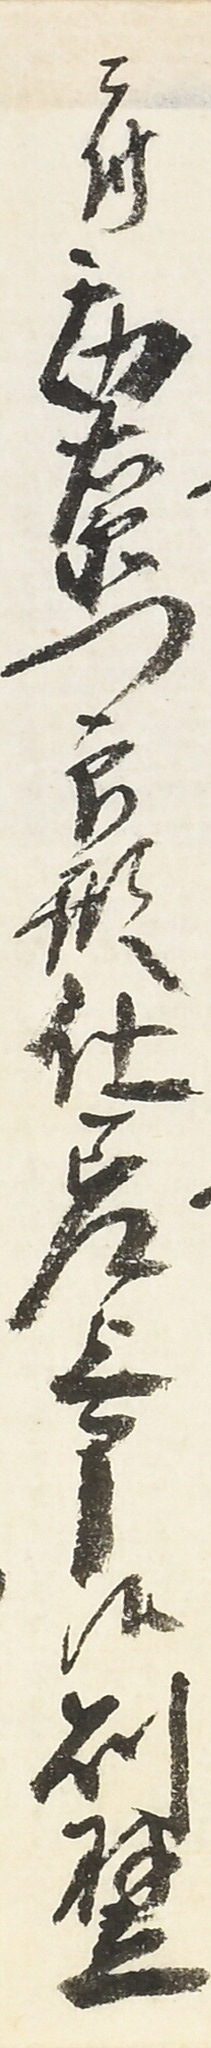ニ付勘右衛門印形仕差上申候則翌
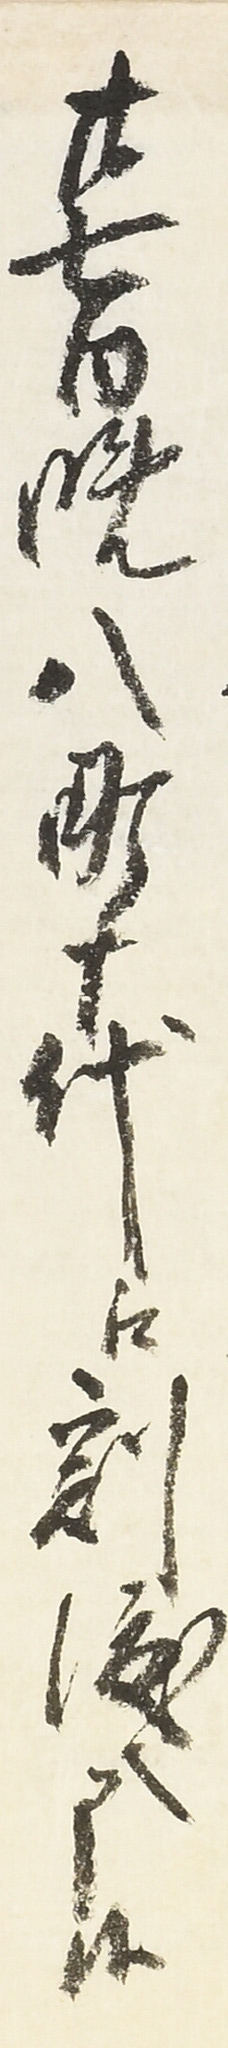廿七日晩八町丁代江割渡被申候
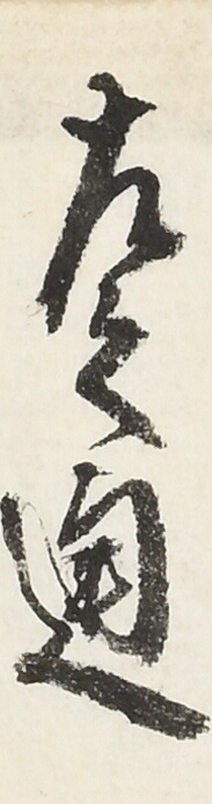左之通
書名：御才覚金御利足割渡扣帳
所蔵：伊那市立高遠町図書館・合同会社AMANE
